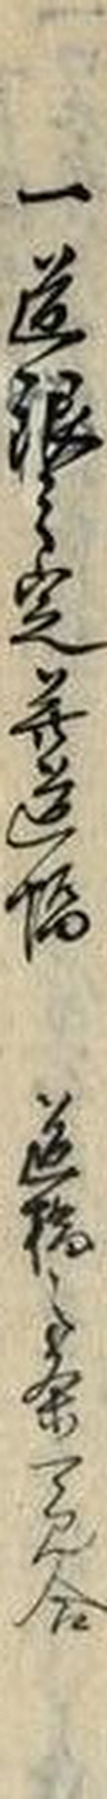一道銀之定幷道幅道橋之条可見合
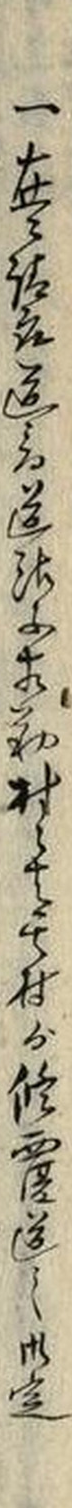一在々請取道ニ而道銀子相勤村々者其村ゟ修覆道之御定
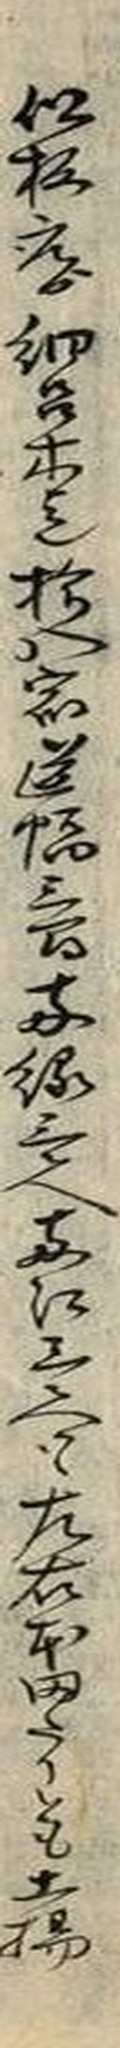但板取ゟ細呂木迄拾八宿道幅三間両縁三尺両江三尺ツヽ左右本田たりとも土揚
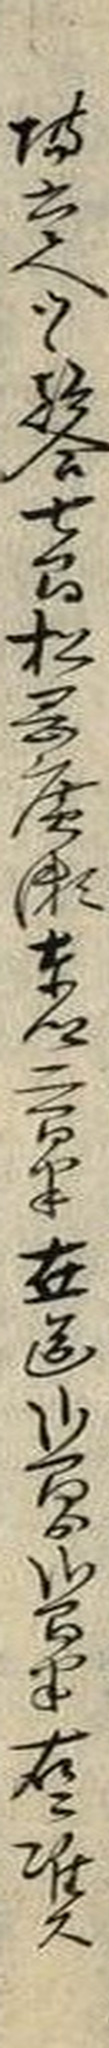場六尺ツヽ都合七間松岡広瀬東郷二間半在道弐間ゟ弐間半右ニ准ス
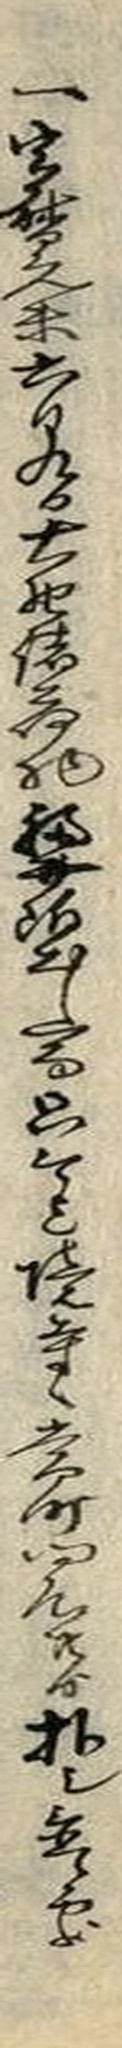一宝暦元未六月九日大野諸荷物福井附出候間只今迄境寺へ当町問屋共ゟ扑シ置候処
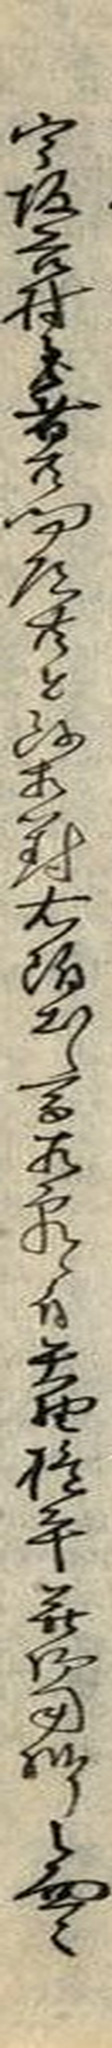宇坂谷村之者共問屋共と致相対右附出之馬相願候ニ付矢野権平幷御用掛り之面々
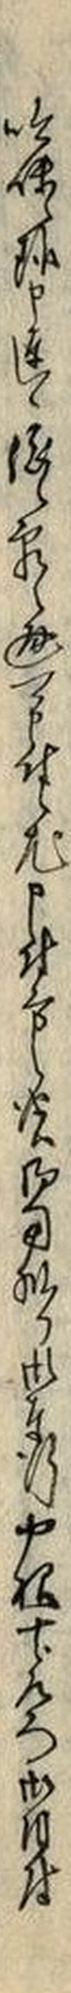吟味候様申達候依之願之通可申付候尤申付方之儀ハ御用掛り御奉行中根十郎左衛門御目付
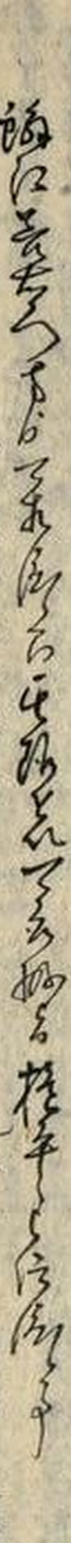蟹江善右衛門方ゟ可相渡候間其趣を以可取扱旨権平へ被仰渡候事
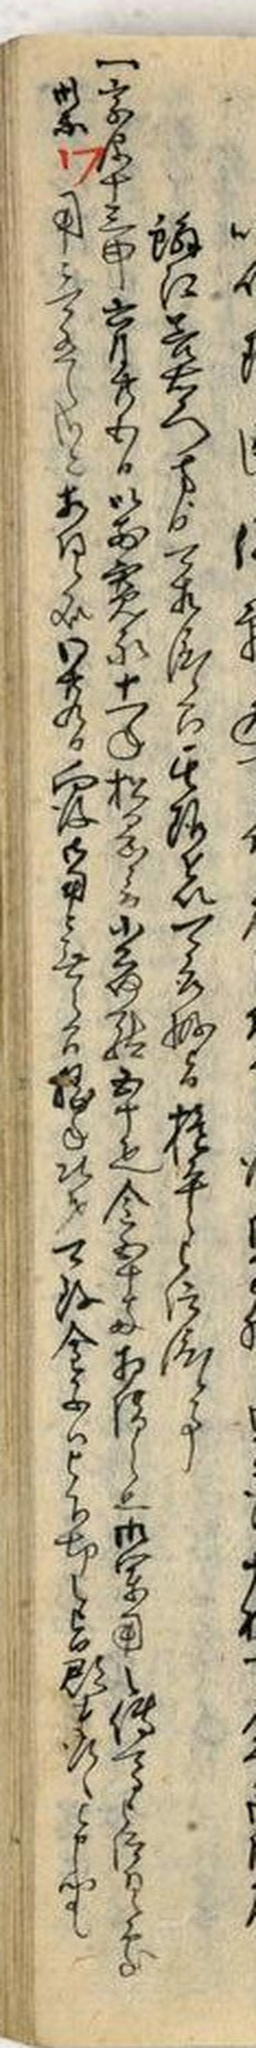一享保十三申六月廿五日以前寛永十一年松岡ニ而小荷駄五十疋金五十両拝借之上御軍用之伝馬被仰付候処
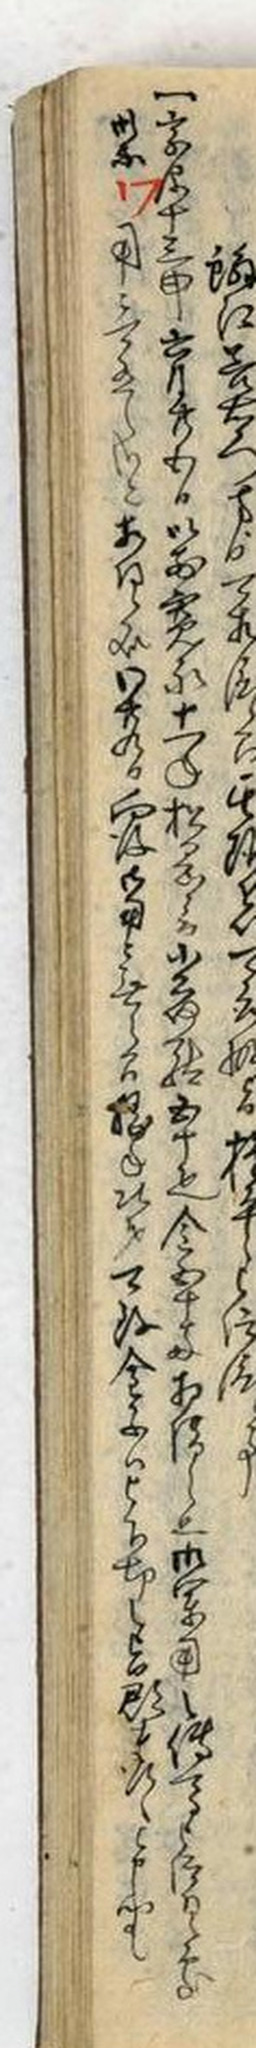御不用ニ可有之哉と相伺候処同廿九日向後御用ニ無之間勝手次第可致金子ハ被下切之旨郡奉行へ被申聞候

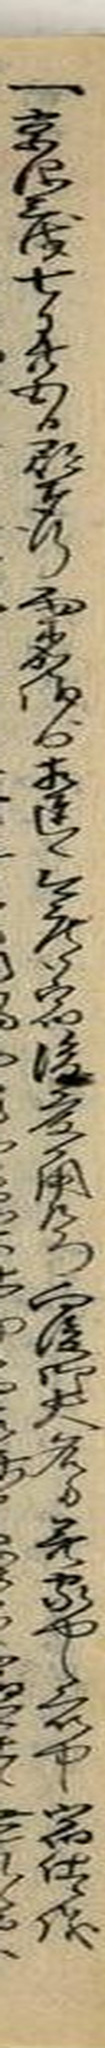一享保三戌七月廿五日郡奉行雨森儀右衛門相達候今庄御宿後藤角左衛門向後御大名方幷家中之衆中宿仕候儀
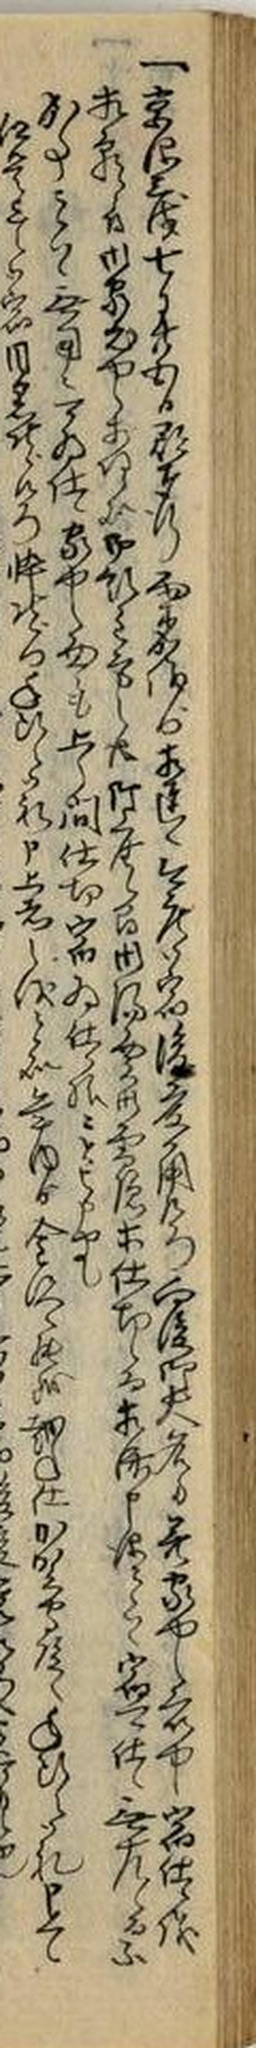相願候ニ付御家老中へ相伺候処御領主方之義御座之間御湯殿御雪隠等仕切候而相済申儀ニ候ハヽ宿可仕候無左候而不
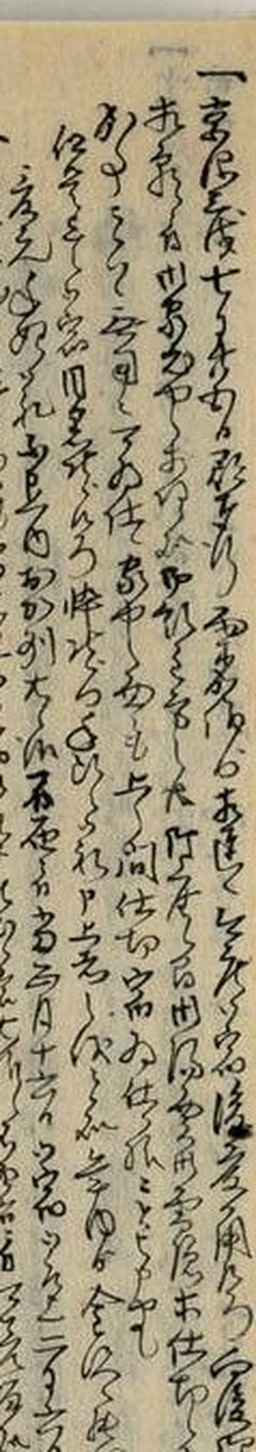成事ニ候ハヽ無用ニ可為仕候家中之面々も上之間仕切宿為仕候様ニと被申聞候
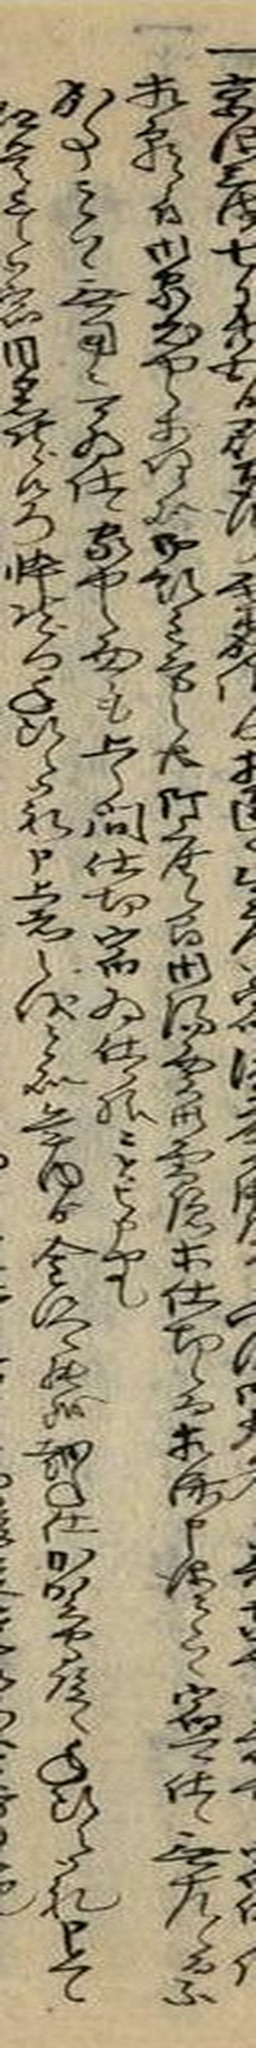但是迄之御宿目黒次郎左衛門忰次郎右衛門年頭之御礼申上者之儀ニ候処年内ゟ金沢へ罷越越年仕加賀守殿へ年頭之御礼申上候
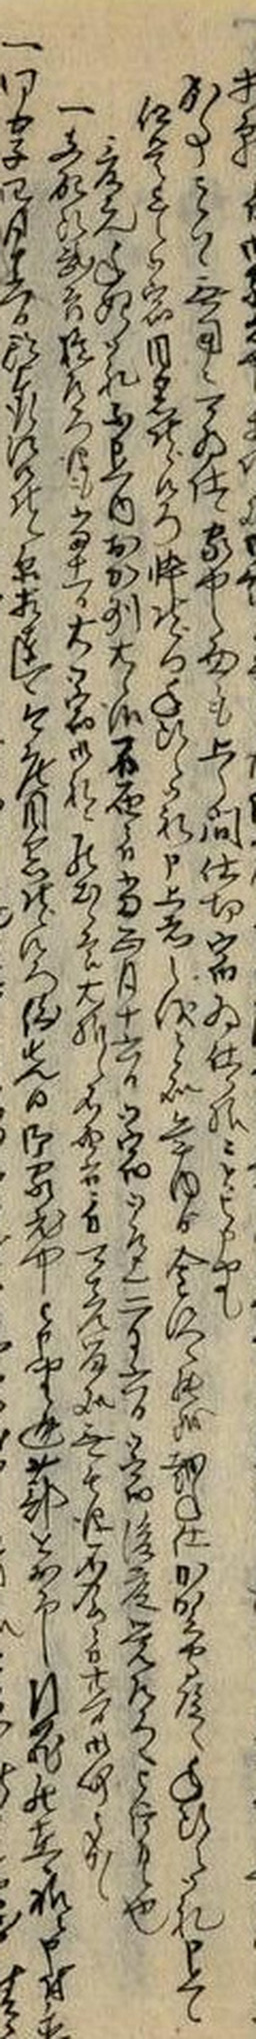爰元年始御礼不申上内於加州右之趣不届ニ付当正月十六日御宿御取上二月六日御宿後藤覚左衛門へ被仰付候也
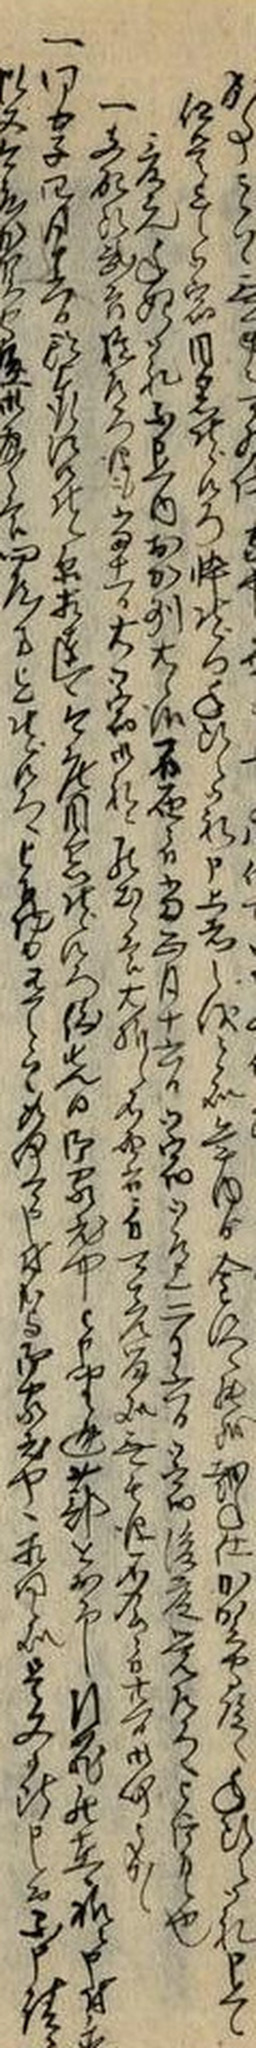一支配頭武曽権左衛門儀も当十一日右御宿御礼ニ罷出候節右様之不届有ニ付可差留処無其儀不念ニ付廿一日御呵被成候
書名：御国他国諸事之部
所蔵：福井県文書館 Fukui Prefectural Archives
